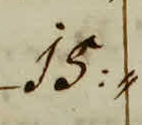15:
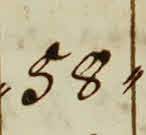58
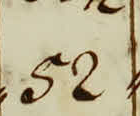52
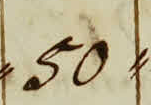50
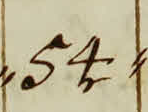54
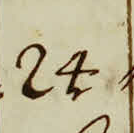24
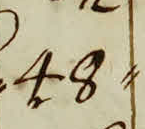48
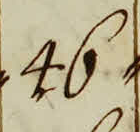46
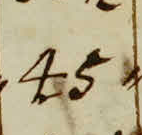45
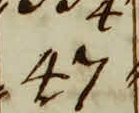47
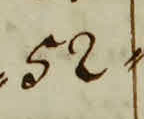52
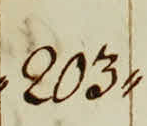203
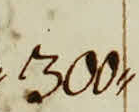300
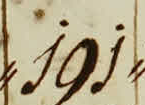191
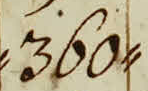360
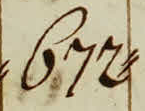672
